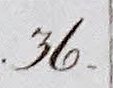36
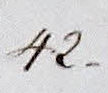42
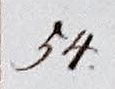54
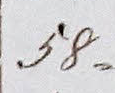58
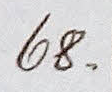68
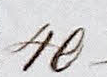40
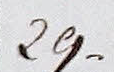29
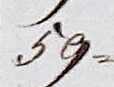59
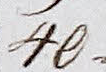40
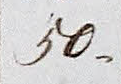50
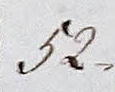52
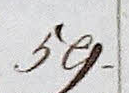59
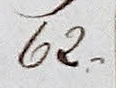62
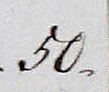50
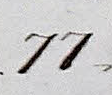77
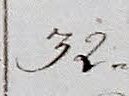32
